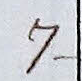7
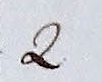2
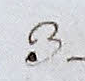3
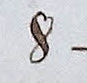8
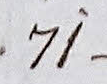71
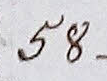58
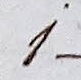1
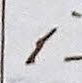1
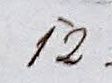12
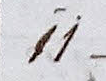11
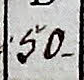50
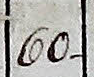60
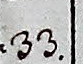33.
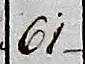61
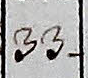33
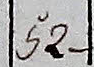52
